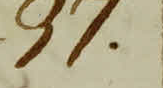37.
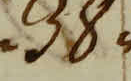38
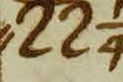22
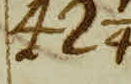42
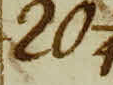20
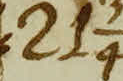21
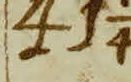41
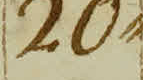20
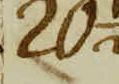20
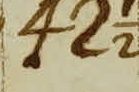42
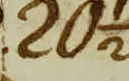20
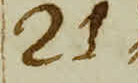21
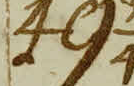49
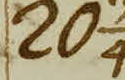20
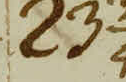23
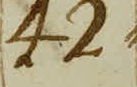42
